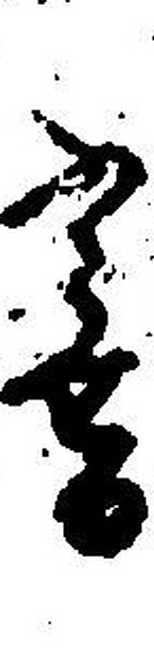ふらせる
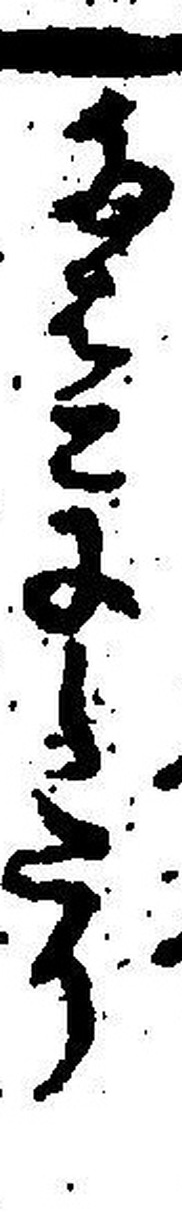たはこにしたり
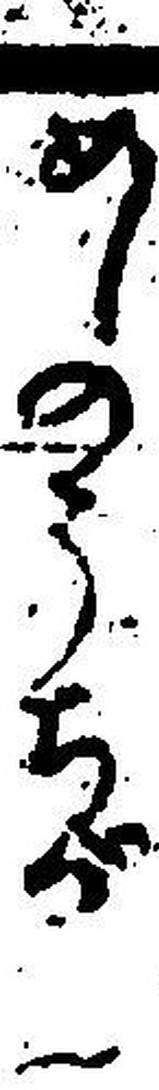めしのうちが
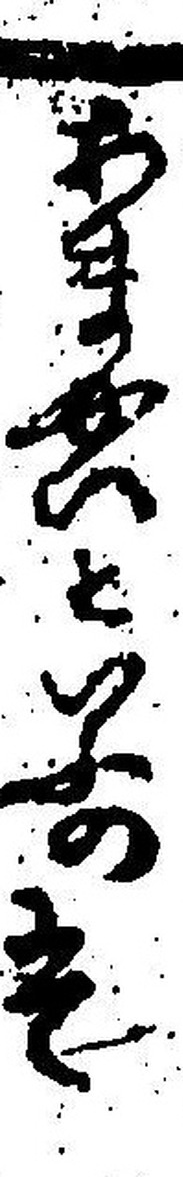あまやいといふのにて
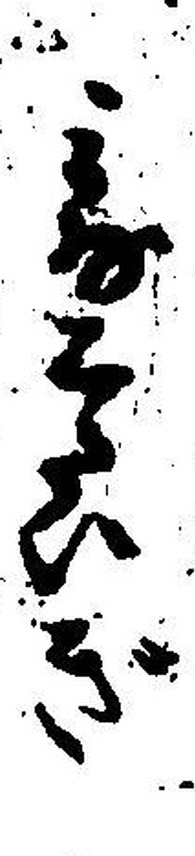みなこたいぎ
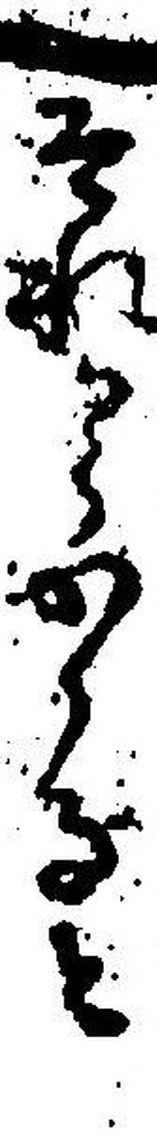それからかゝると
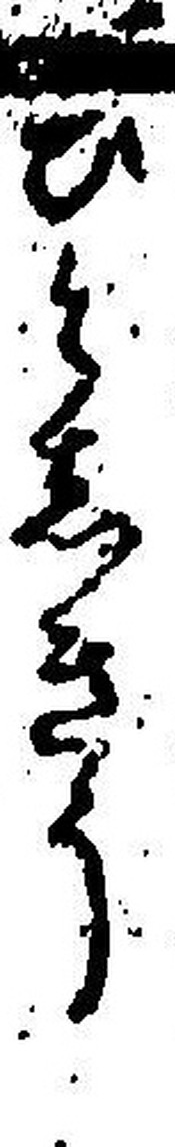ひとしきり
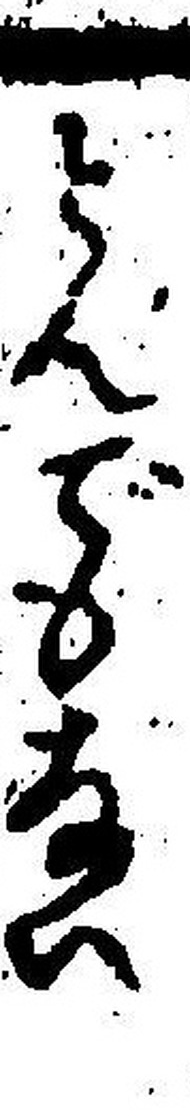とんでもない
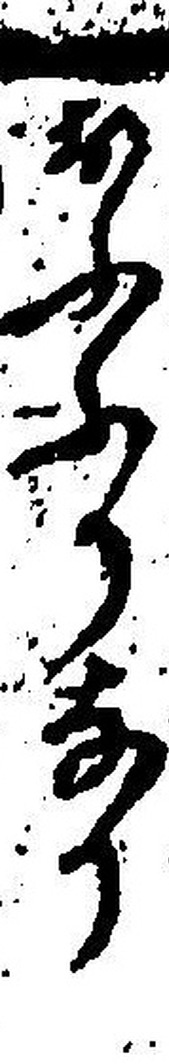おふふりなり
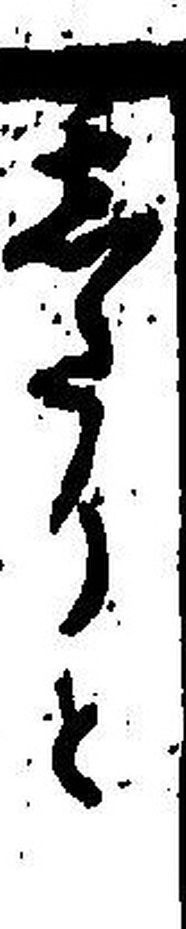したりと
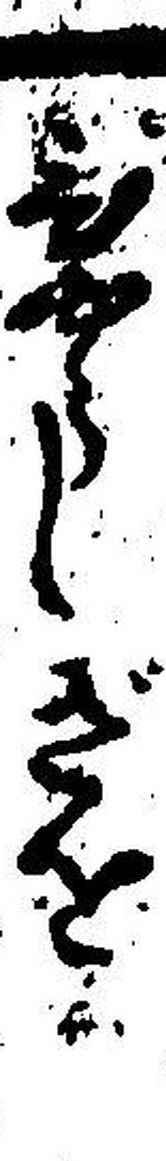ひやうしぎを
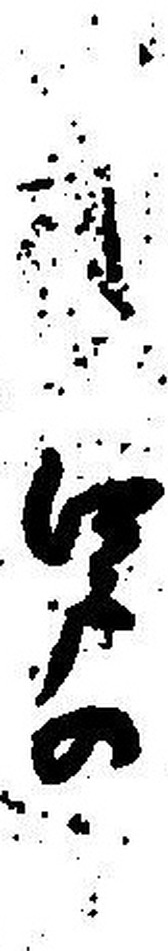江戸の
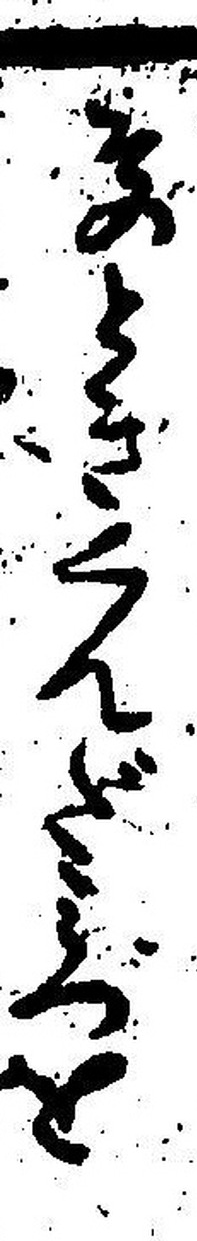そのときくんだみづを
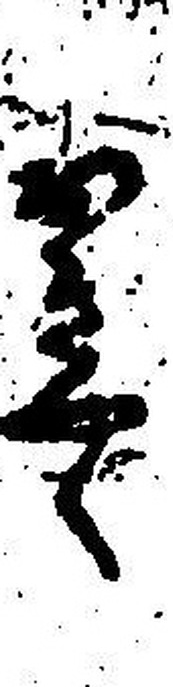おきやく
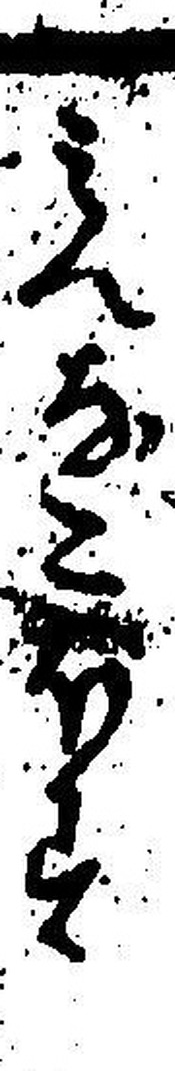みんなこぼす
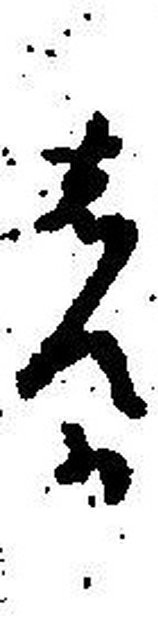しんか
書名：牡丹餅棚有 / 市場通笑作
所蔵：東京大学総合図書館 General Library in the University of Tokyo, JAPAN
